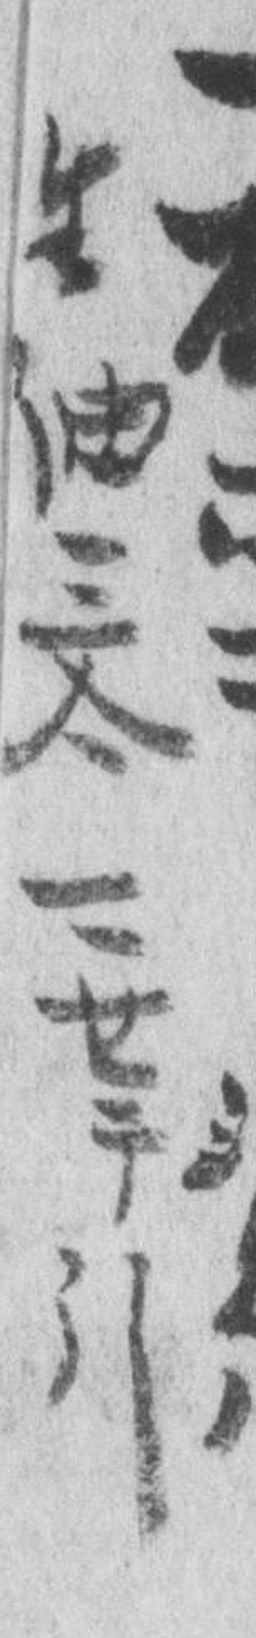生油三合ませて引
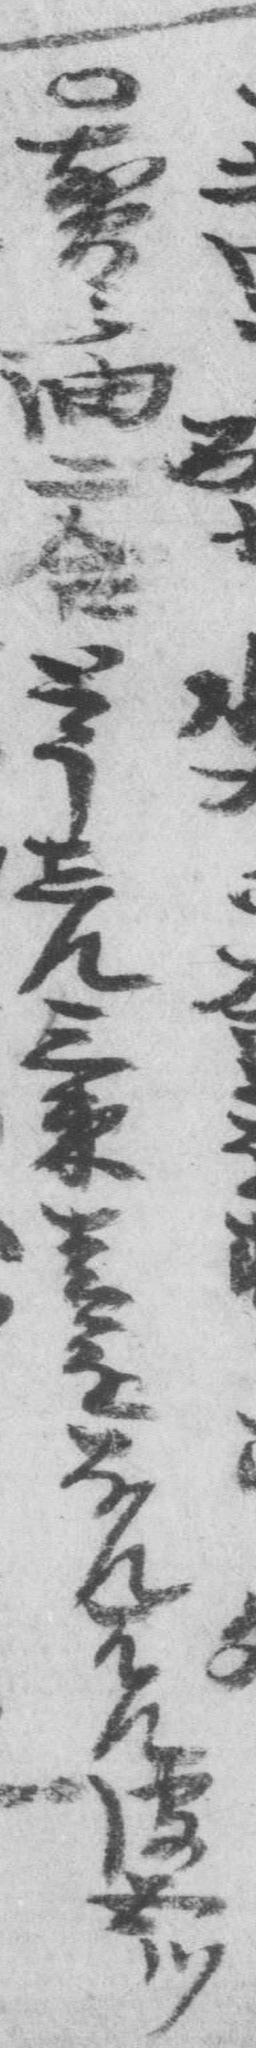○煎し油二合とうしん三束青？を？なんはん皮五つ
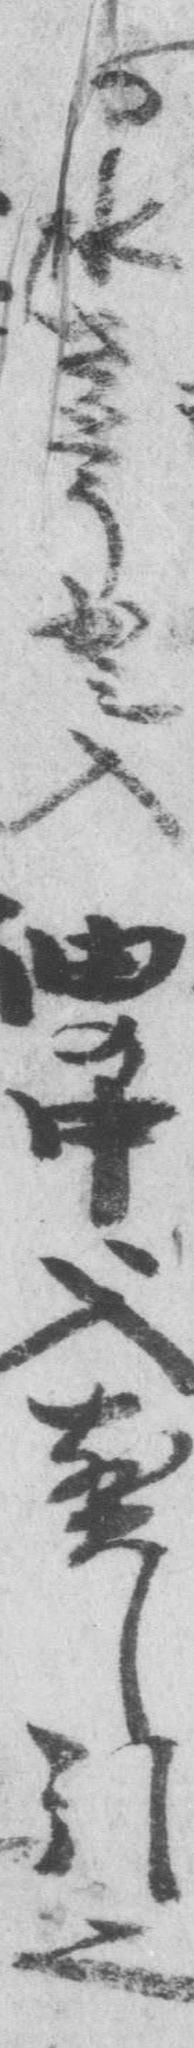○水さとう少し入油の中、入煎し？引也
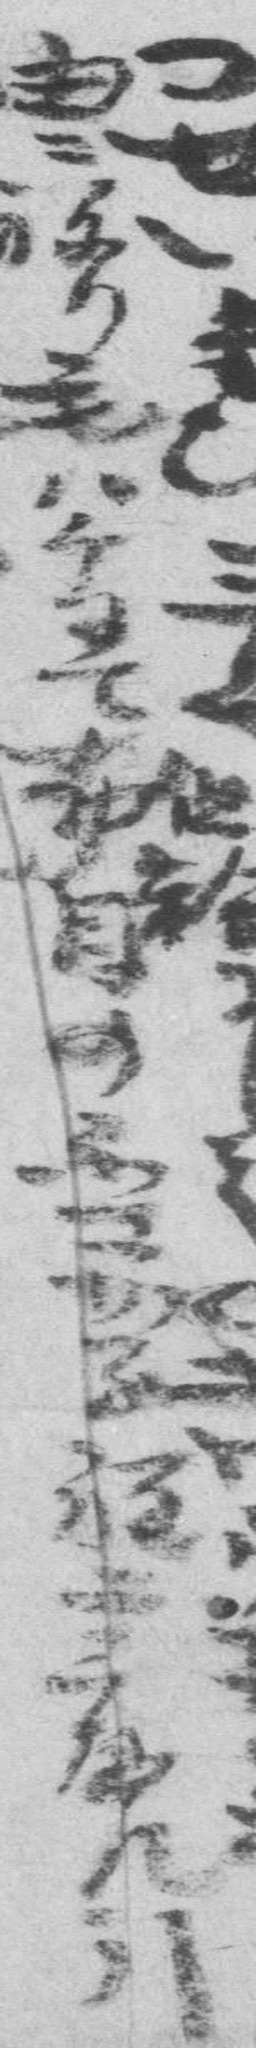油にねり毛ハケにて布目のふさかる程二三度引
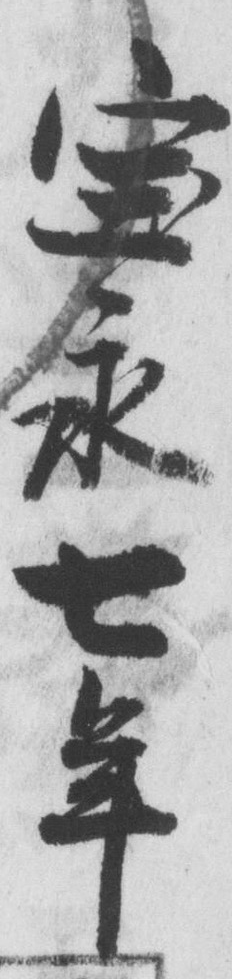宝永七年
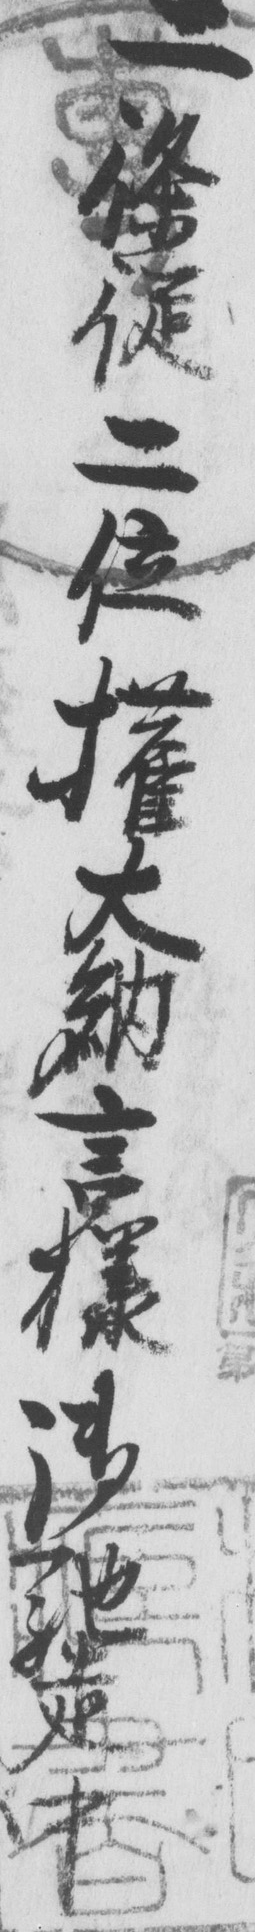二條従二位権大納言様御馳走中
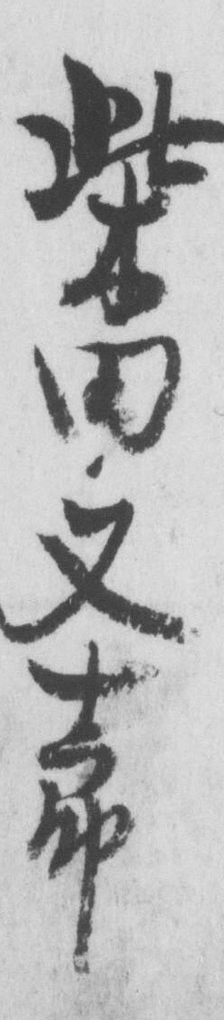柴田又十郎
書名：御料理献立
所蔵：大阪府立大学学術情報センター 国文学研究資料館
